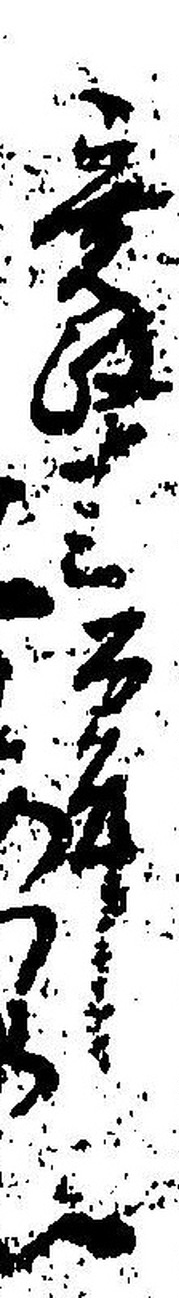寛政十三年
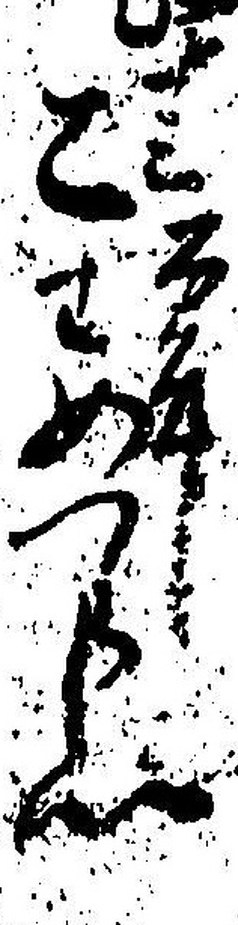こわめつらしい
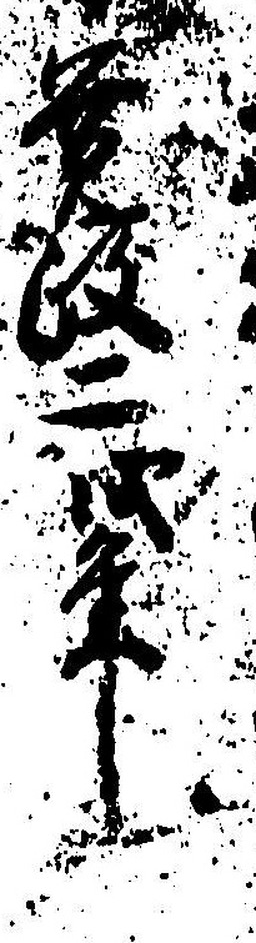寛政二戌年

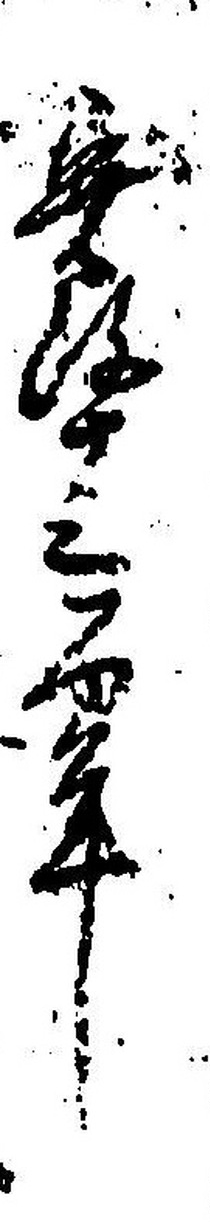寛政十三酉年
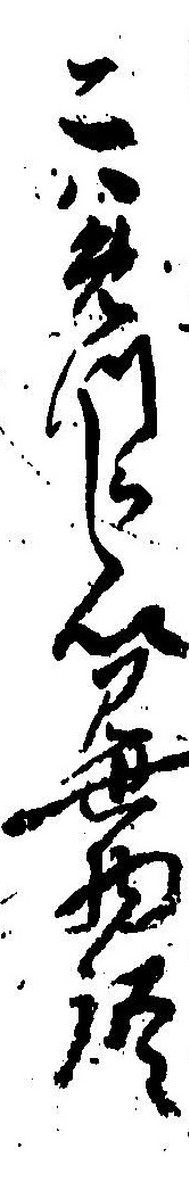こはめつらしい見世物語
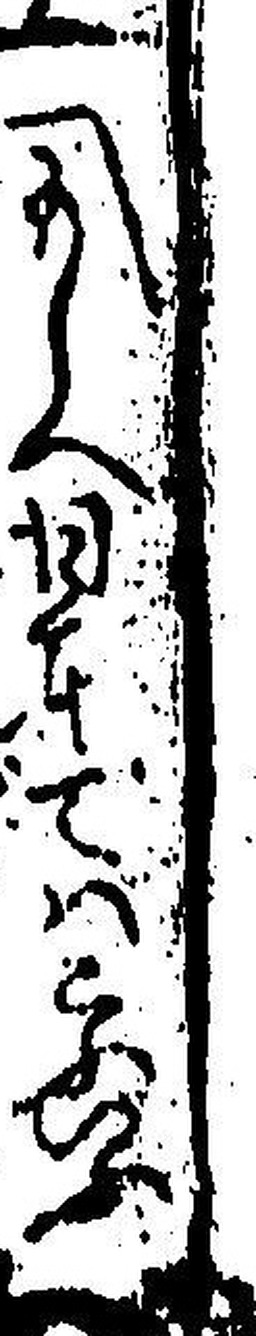〽もしへ日本てはこふいふ
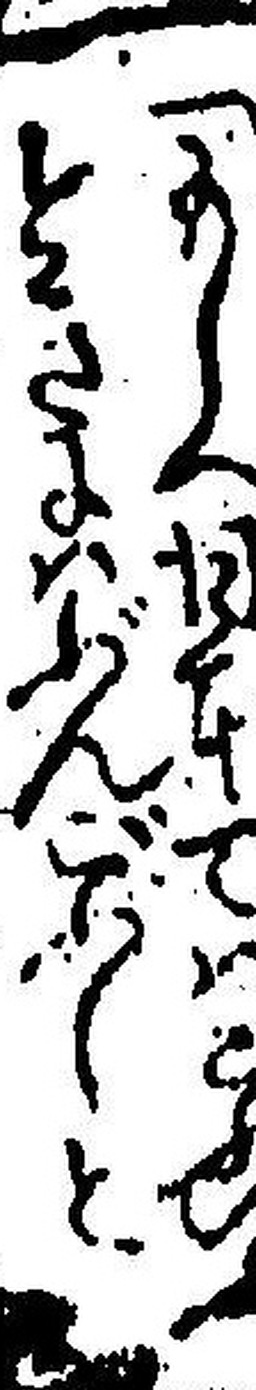ときにはぶんごふしと
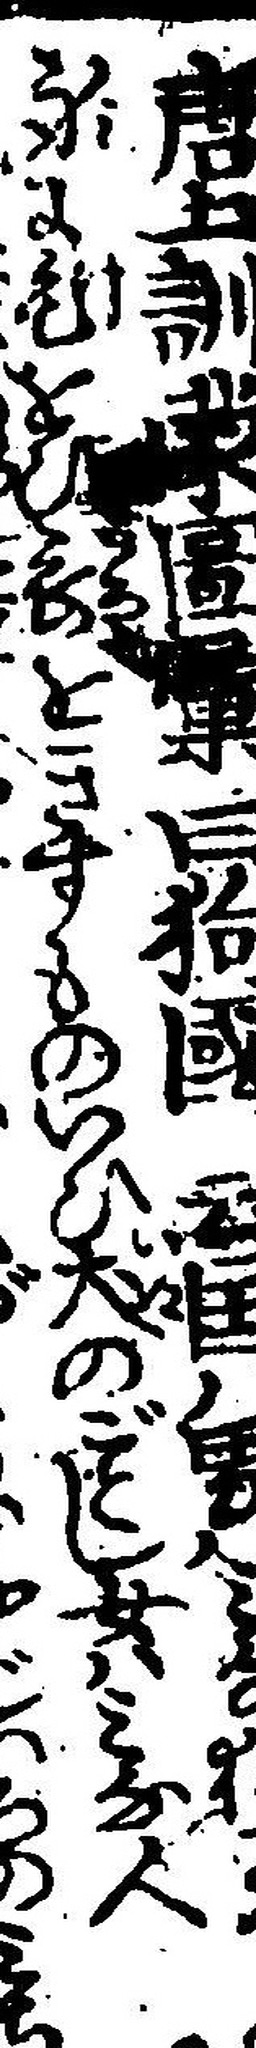身に毛をひ衣をきすものいひ犬のごとし女はみな人
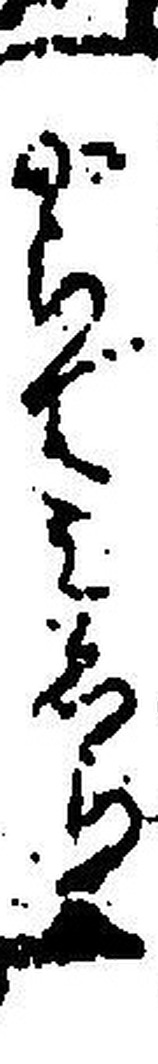やらでみしら
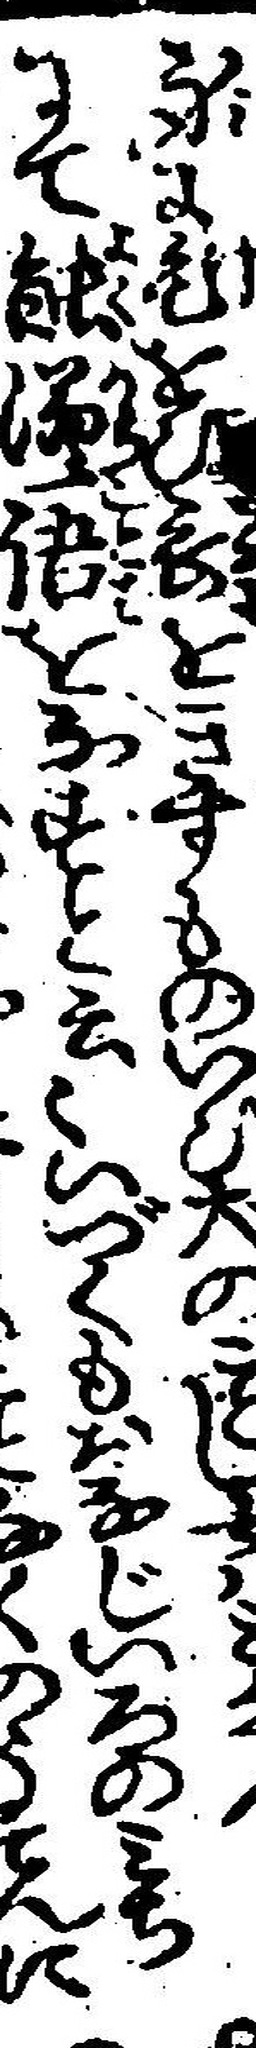にて能漢語をなすと云々いづくもおなじいろのみち
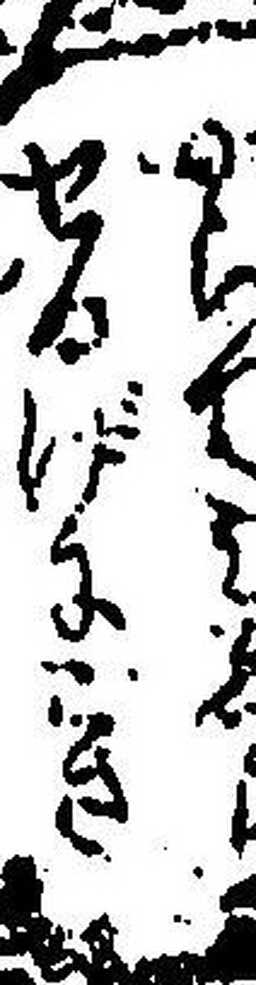せるげにこさ
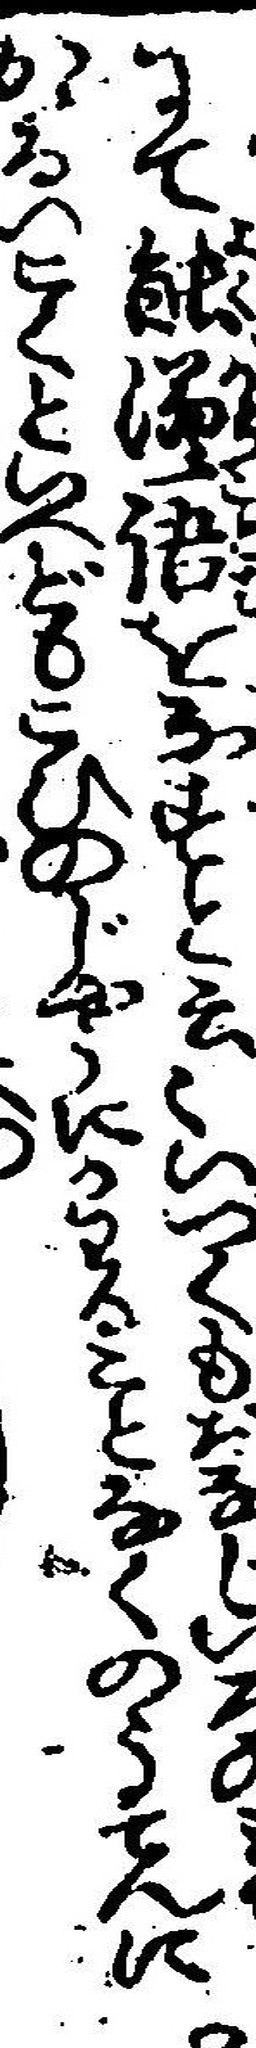かゝるいこくといへどもじやうにかわることなくのうてんに
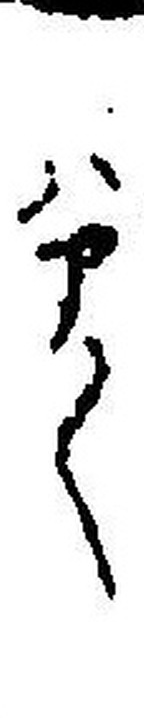ハア〳〵
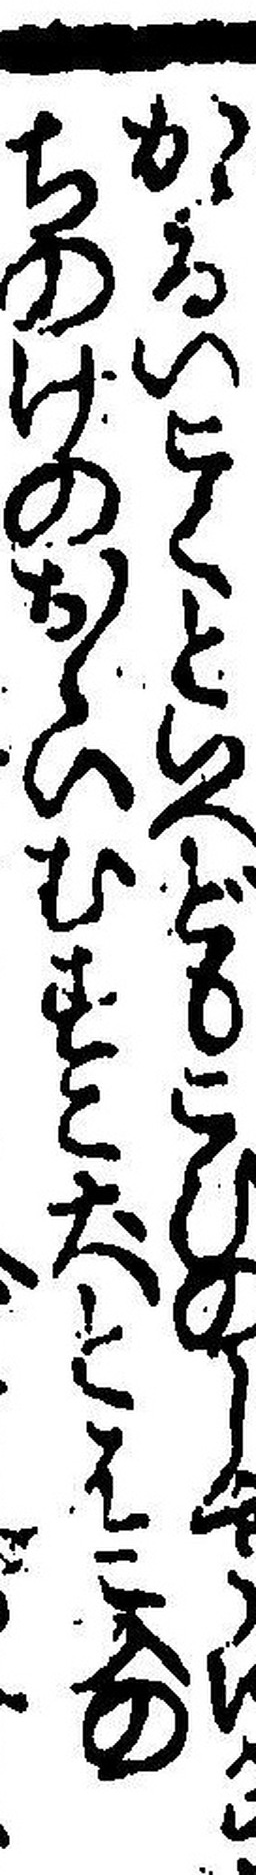ちのけのおゝいむすこ犬とはこ入の
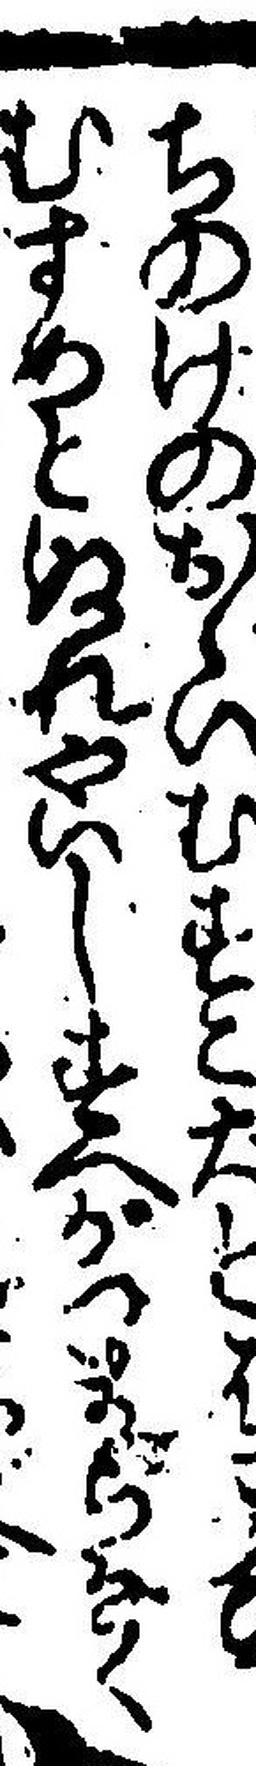むすめとぬれやいしすへがつまらなく
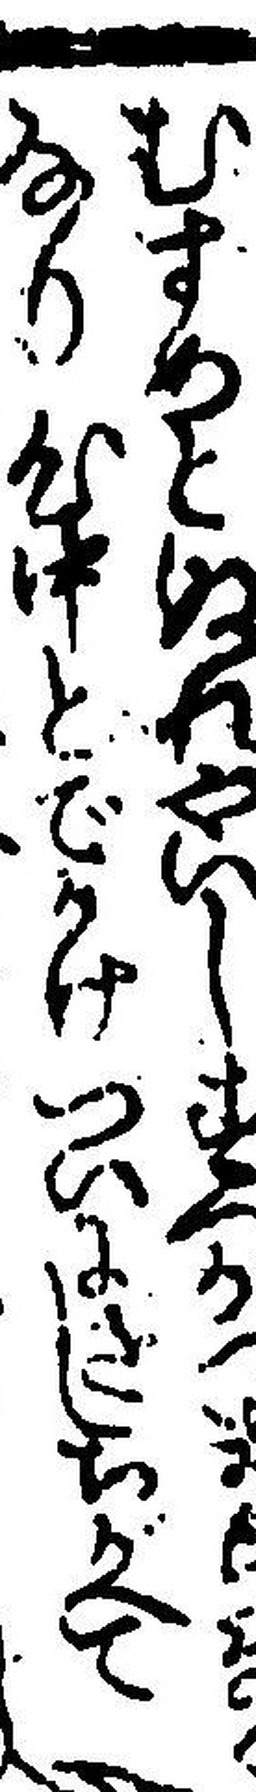なり心中とでかけついにさしちがへて
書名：花芳野犬斑 / 山東京伝作
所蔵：東京大学総合図書館 General Library in the University of Tokyo, JAPAN
